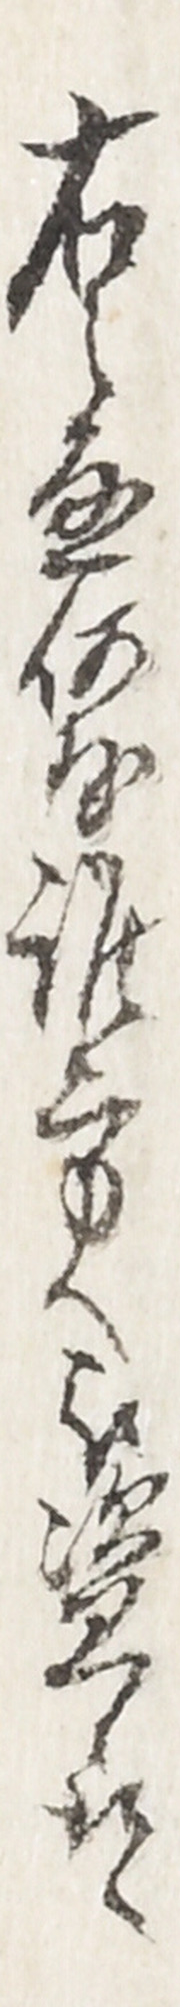右之通何屋誰上方へ被盗候取候
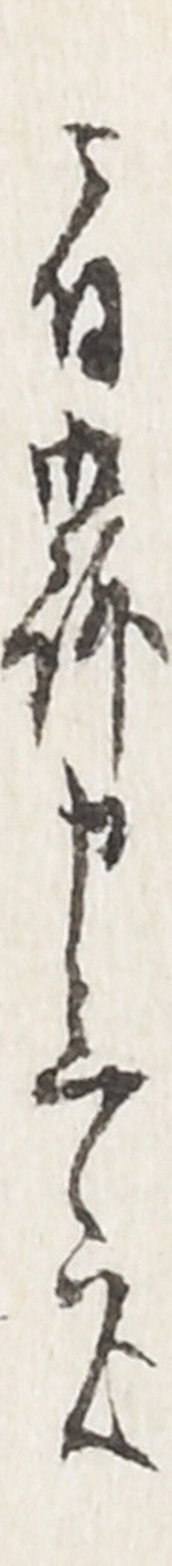ニ付御訴申上候以上
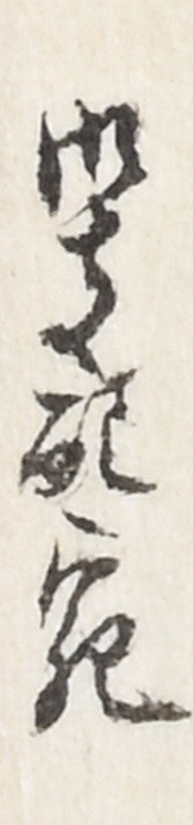御支配宛

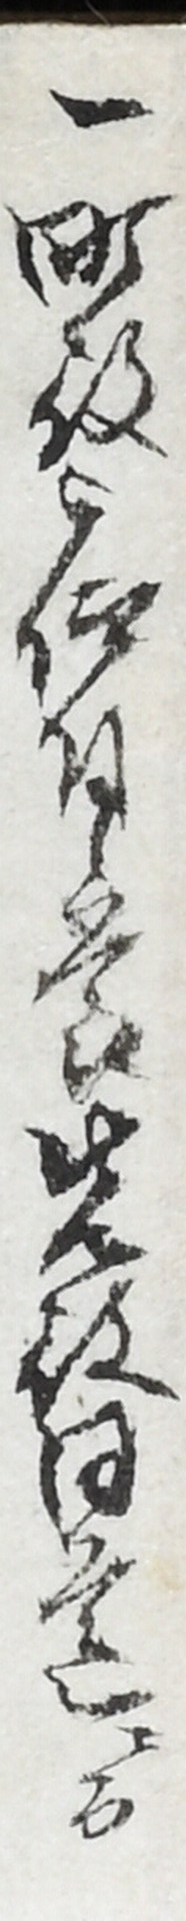一町役被仰付候節先役同道ニ而
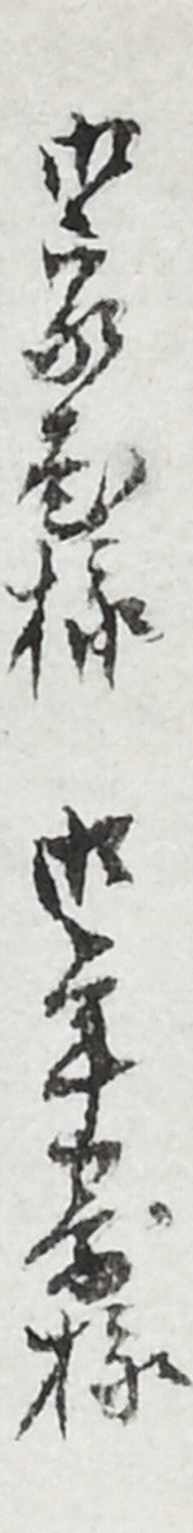御家老様御年寄様
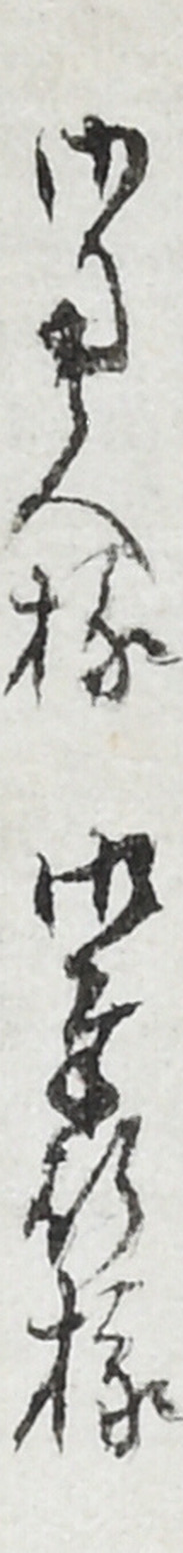御用人様御奉行様
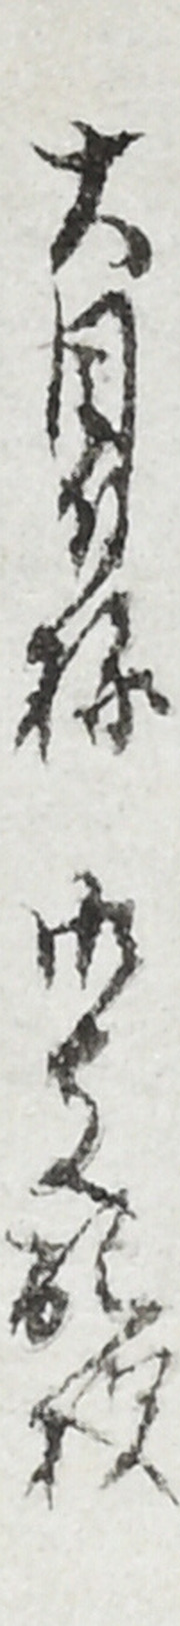大目付様御支配様
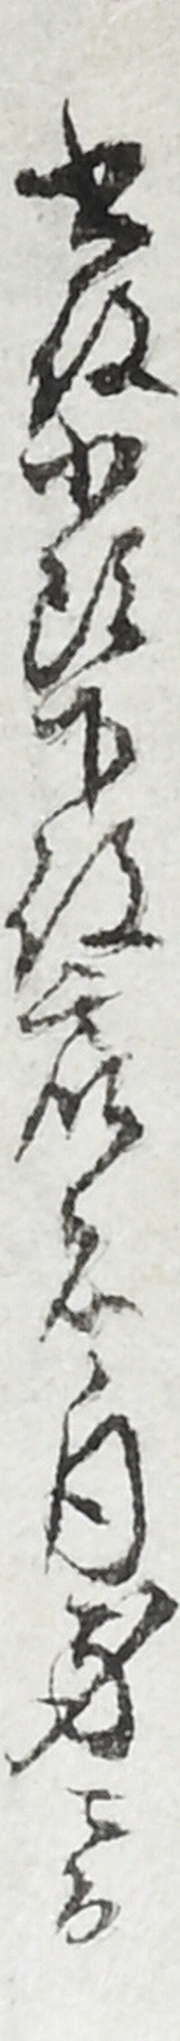書役小頭下役衆者自身ニ而
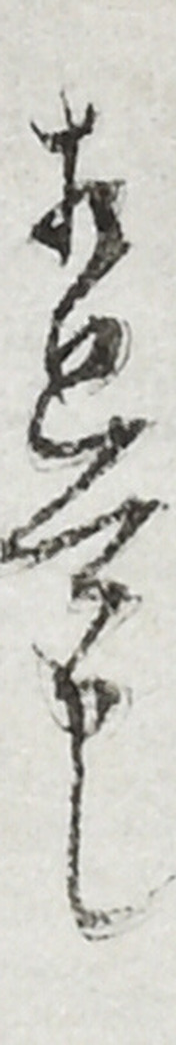相廻可申候
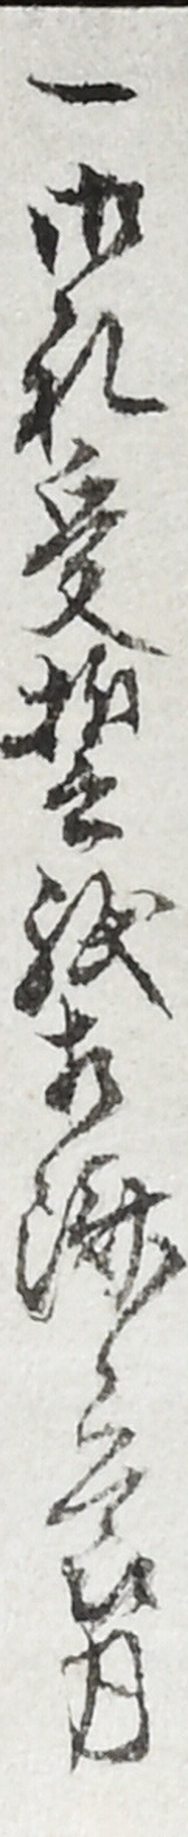一御礼受誓紙相済候節御用
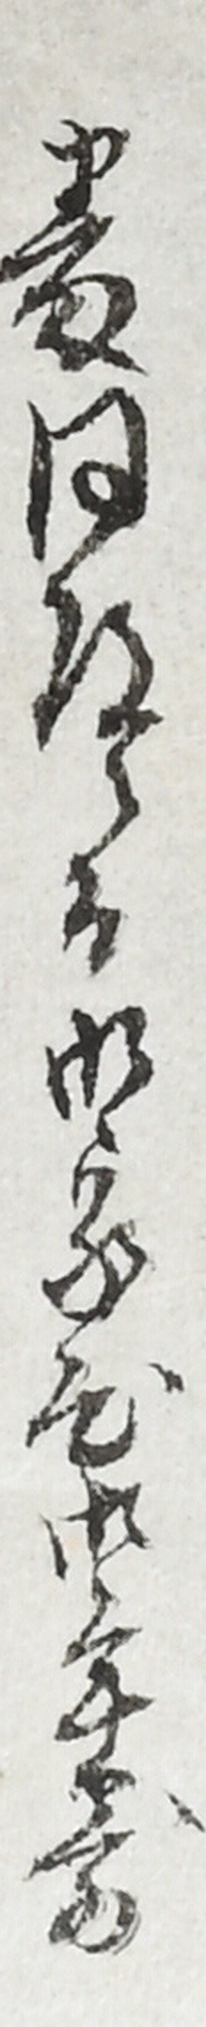番同道ニ而御家老御年寄
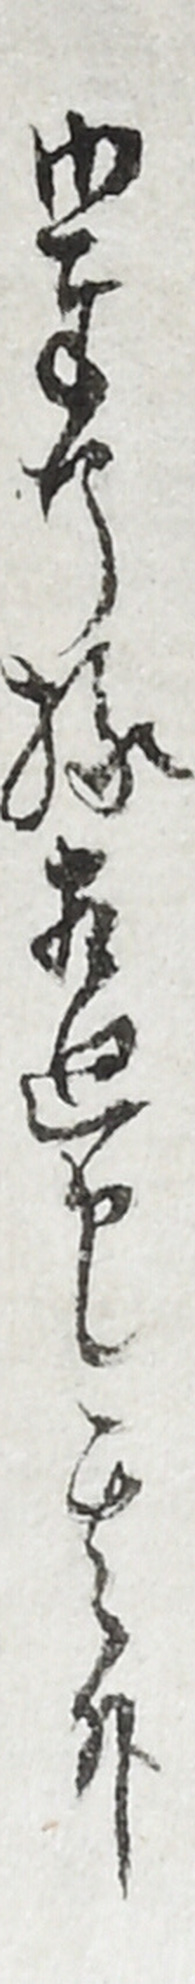御奉行様相廻申候其外
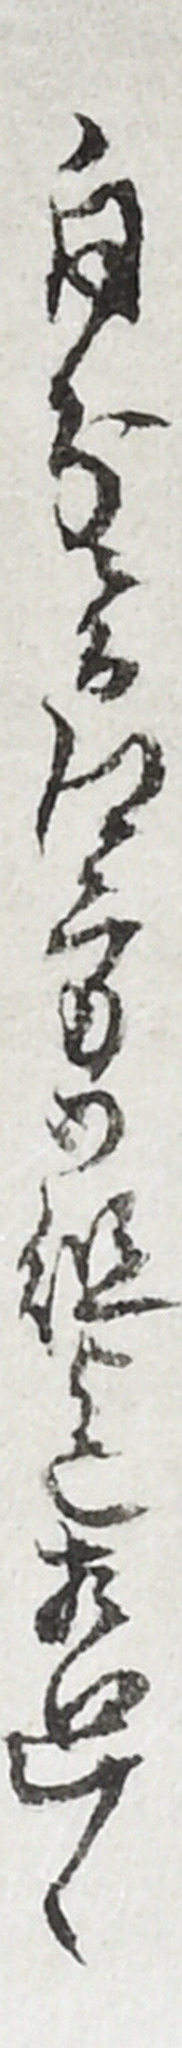自分ニ而郷方御組迄相廻候
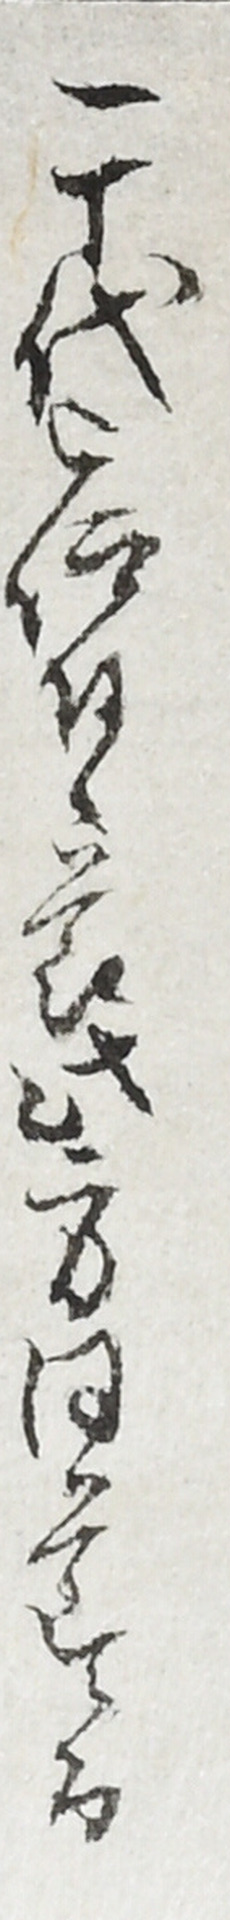一丁代被仰付候節此方同御道候而
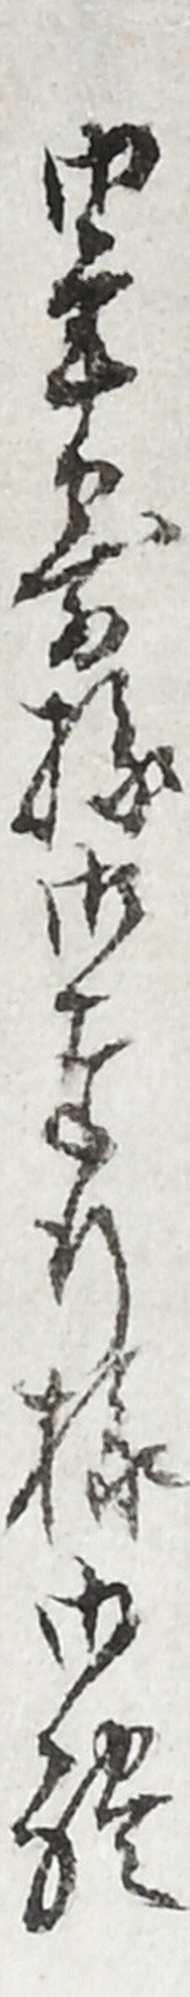御年寄様御奉行様御礼
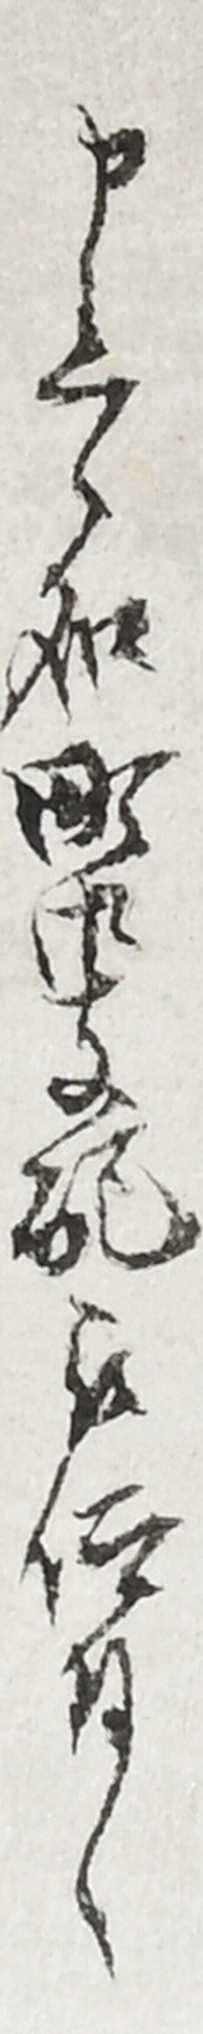申上候処町御支配被仰付候
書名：年内行事懐中録
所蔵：伊那市立高遠町図書館・合同会社AMANE
